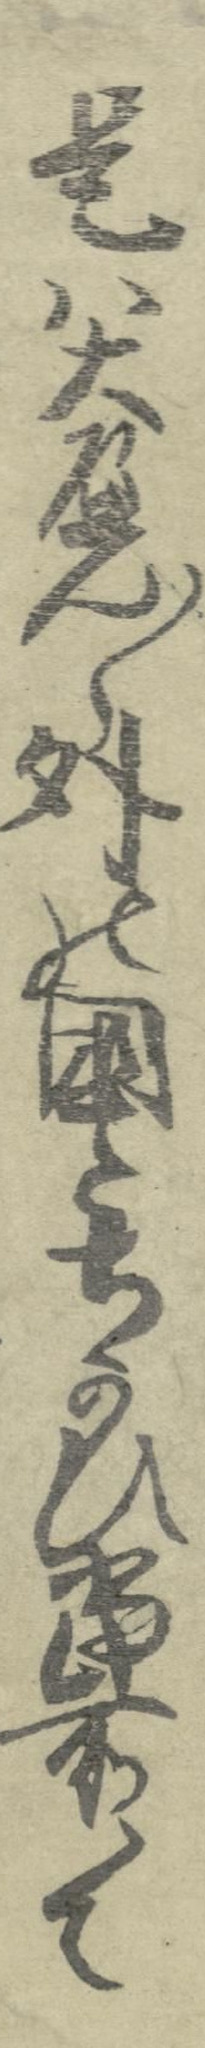是は大へん〳〵外の国とちかひ当所ニて
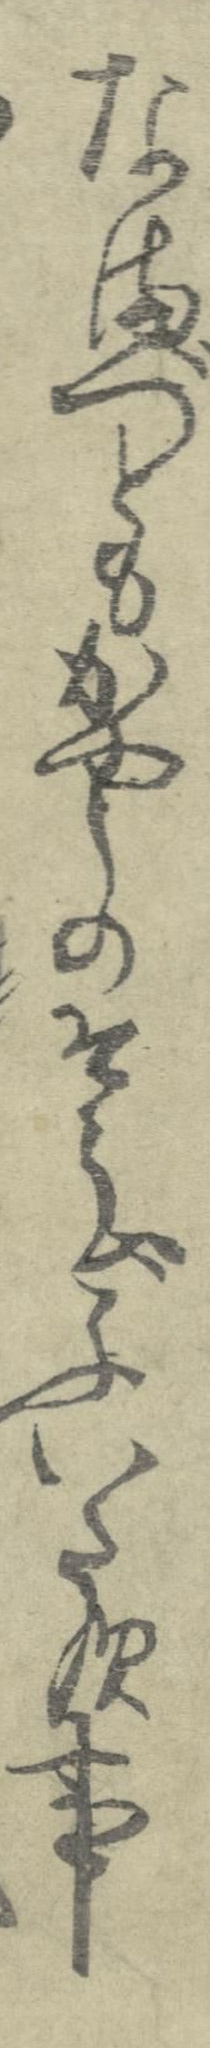なまづともかやうのそうどふいたす事
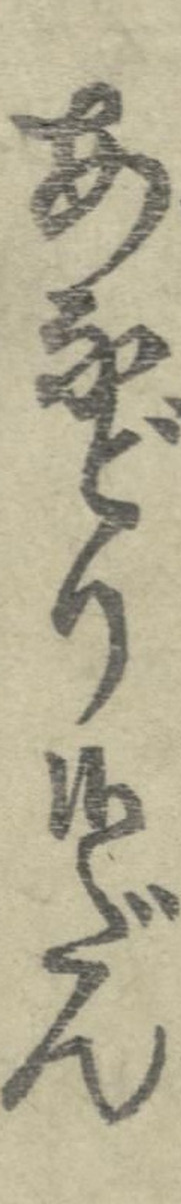あなどり候だん
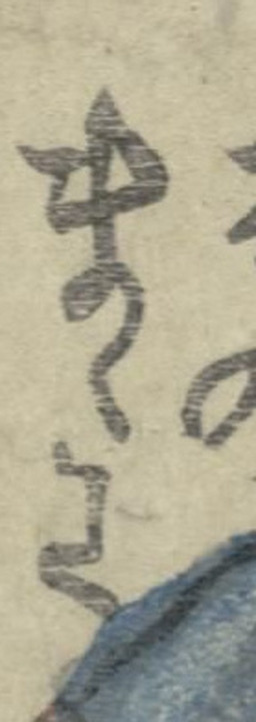まゝに
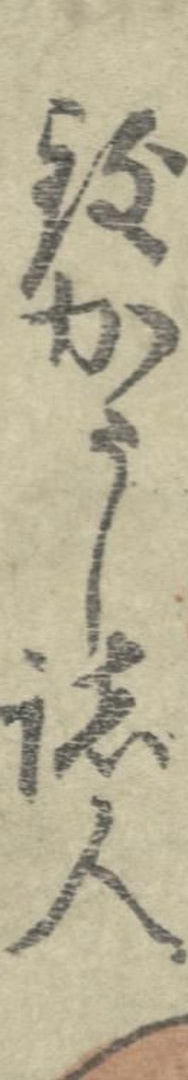致かたし諸人
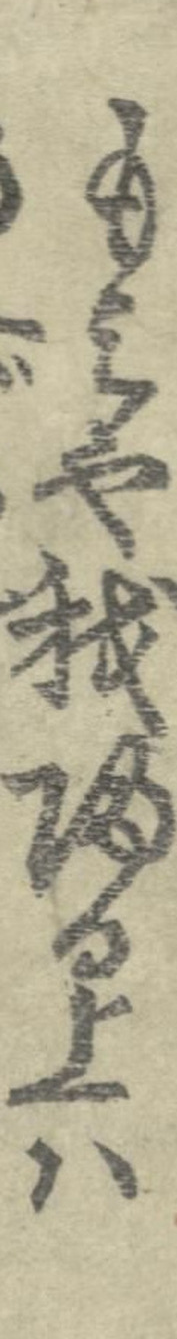もはや我帰る上は
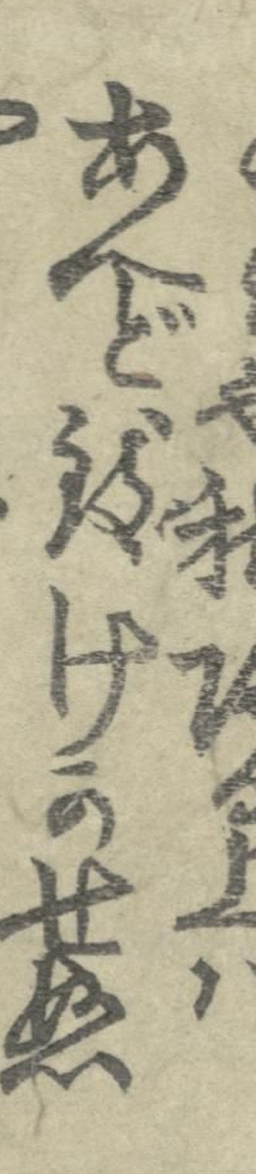あんど致けかせぬ
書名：[八幡宮・太神宮・鹿島大明神]
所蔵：東京大学地震研究所図書室 Earthquake Research Institute Library, The University of Tokyo, JAPAN
